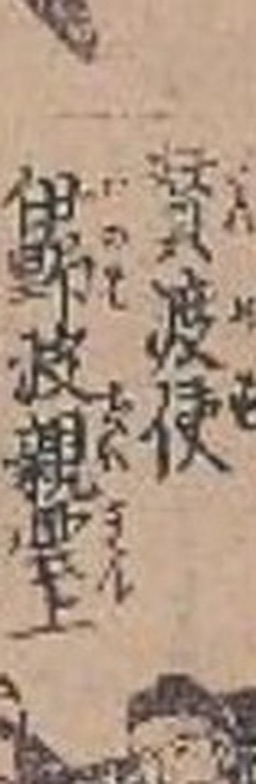伊野波親雲上
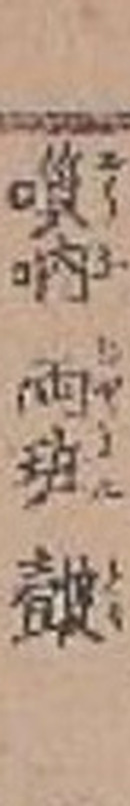嗩吶両班鼓
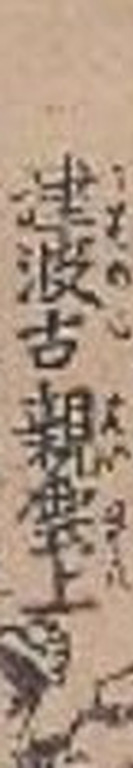津波古親雲上
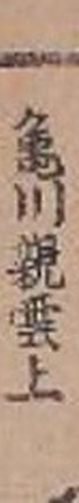亀川親雲上
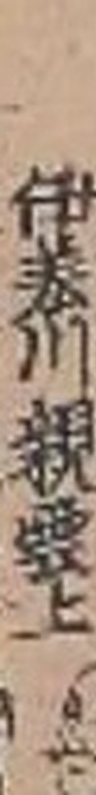伊差川親雲上
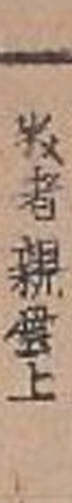牧者親雲上
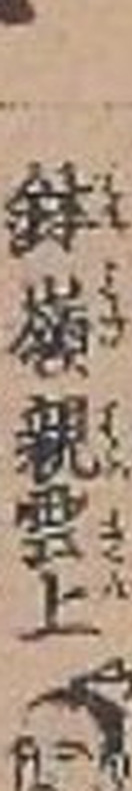鉢嶺親雲上
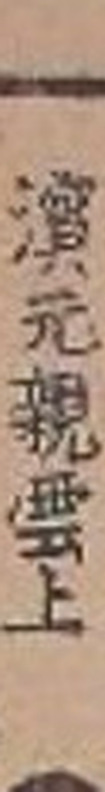濱元親雲上
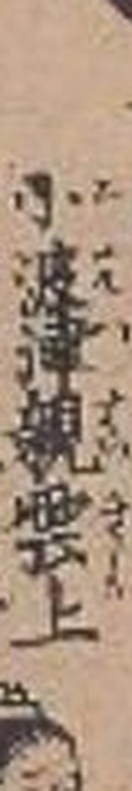小波津親雲上
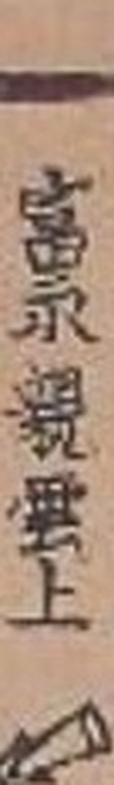富永親雲上
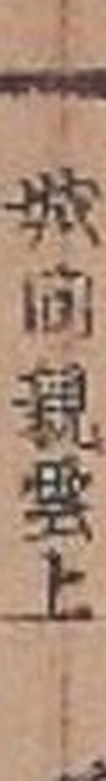城間親雲上
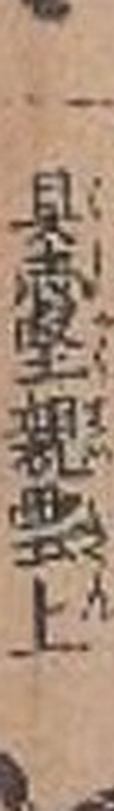具志堅親雲上
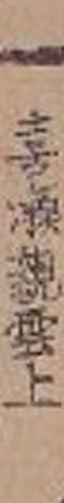喜瀬親雲上
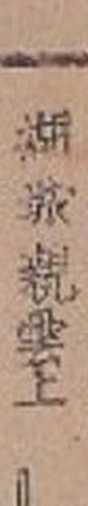湖城親雲上
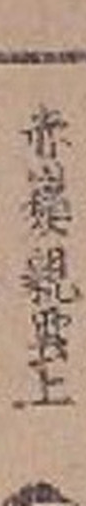赤嶺親雲上
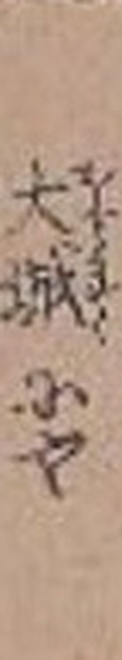大城にや
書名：琉球人行列附 天保十三壬寅年十一月
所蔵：University of the Ryukyus Library
